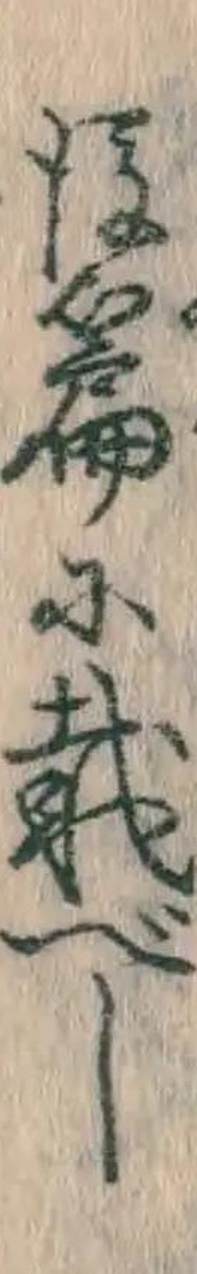後篇に載べし
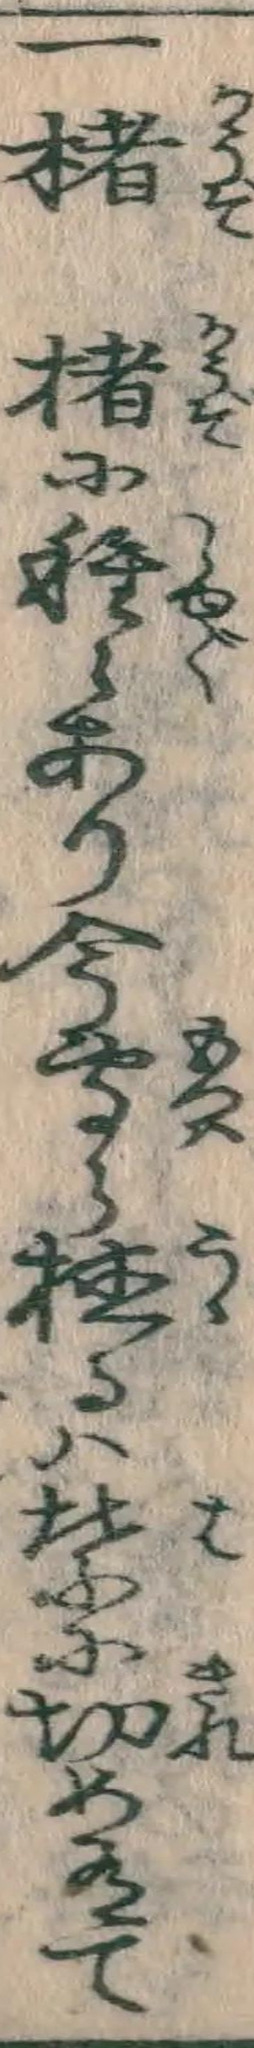一楮楮に種々あり今専ら植るは葉に切め有て
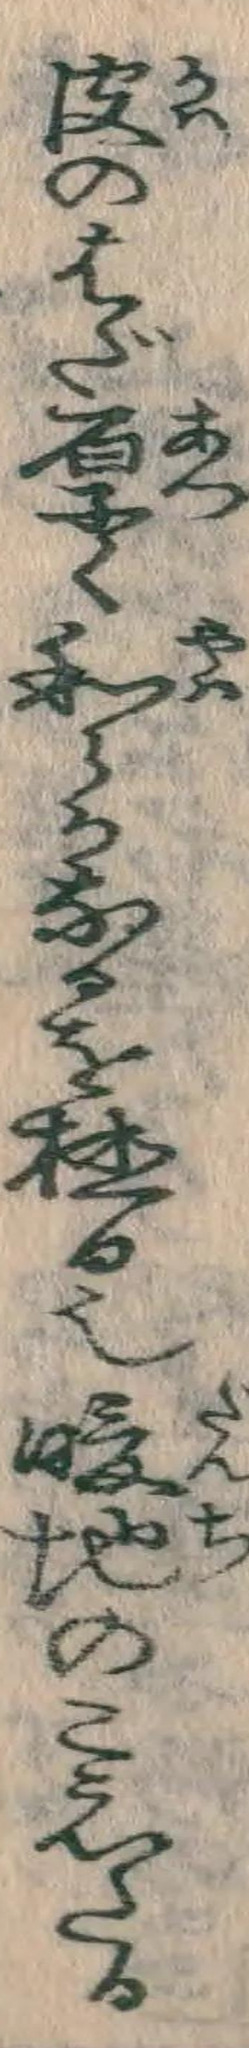皮のはだ厚く和らかなるを植る也暖地のこえたる
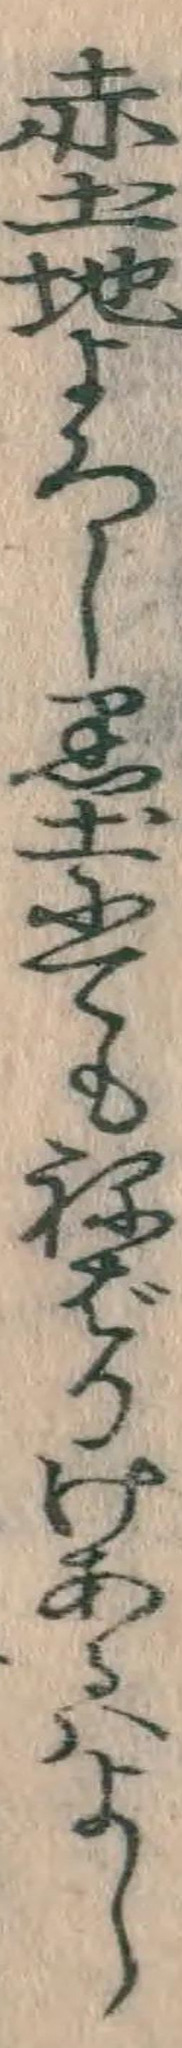赤土地よろし黒土にてもねばりけあるはよし
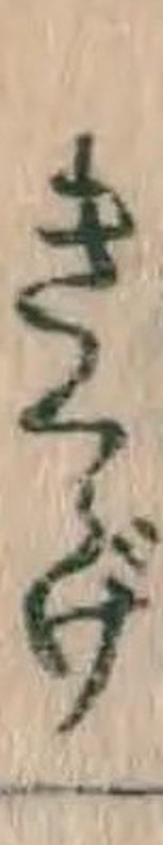きくらげ
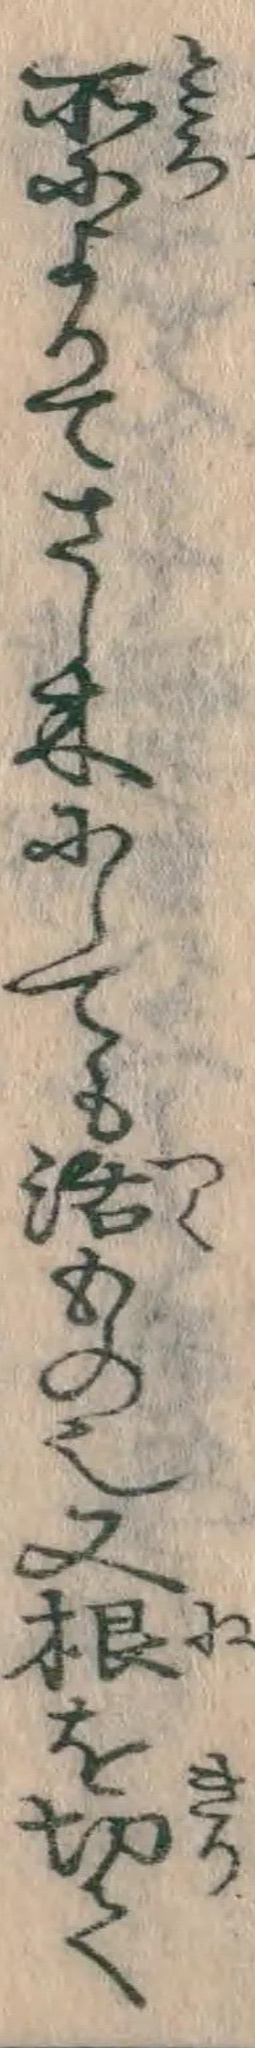所によりてさし木にしても活もの也又根を切て
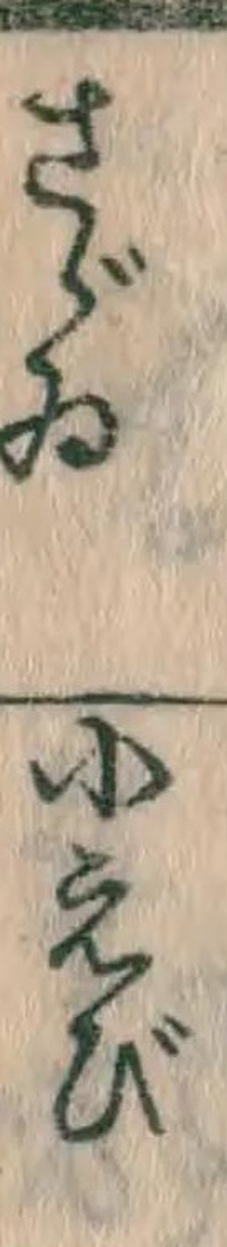さゞゐ小えび雁
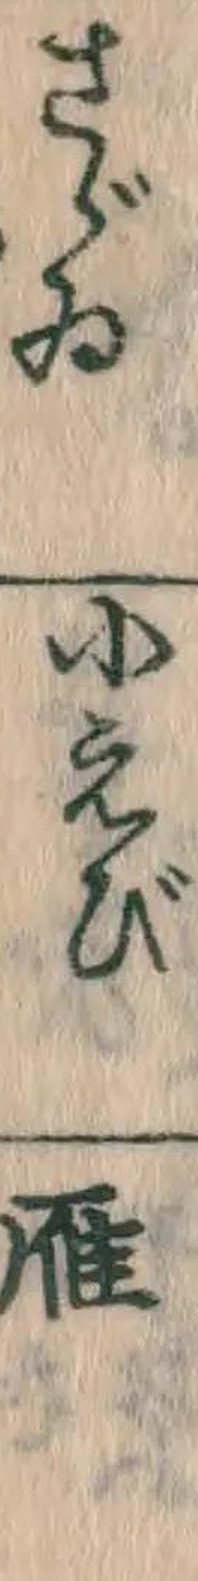さゞゐ小えび雁
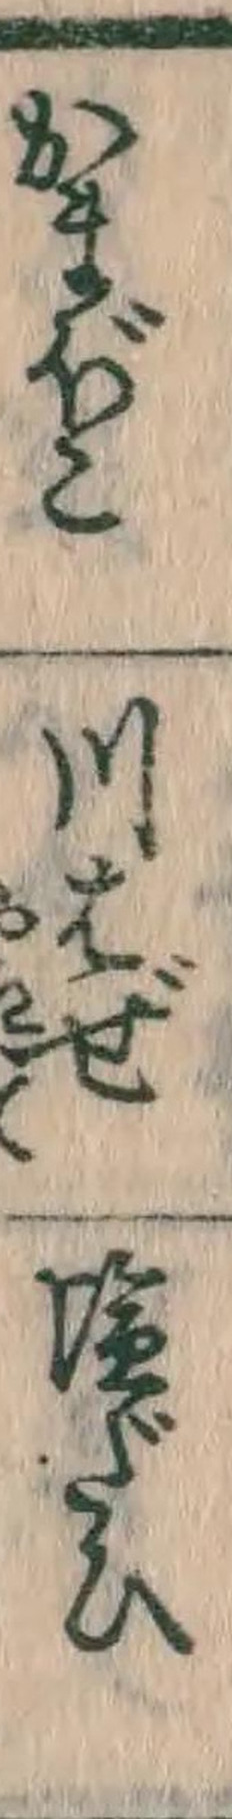かまぼこ川はぜ塩だひ
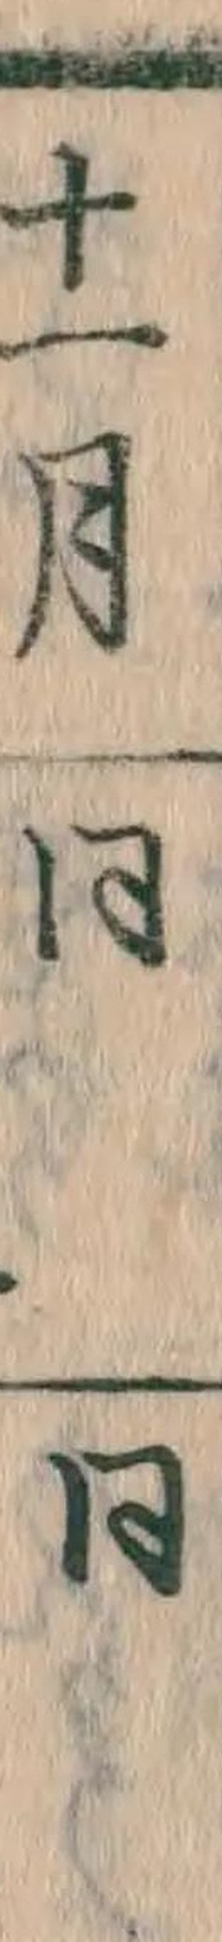十一月同同
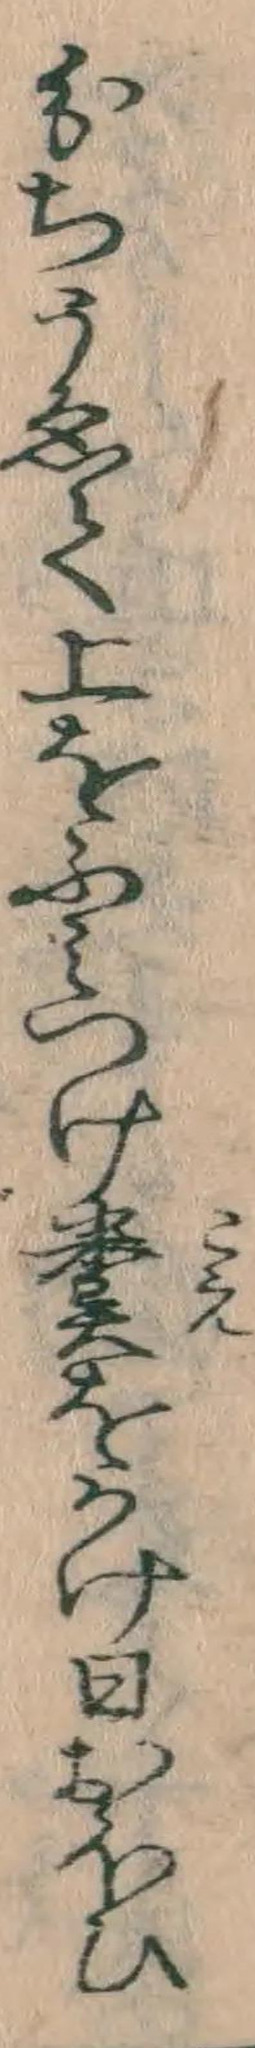分ちうゑて上をふみつけ糞をかけ日おほひ
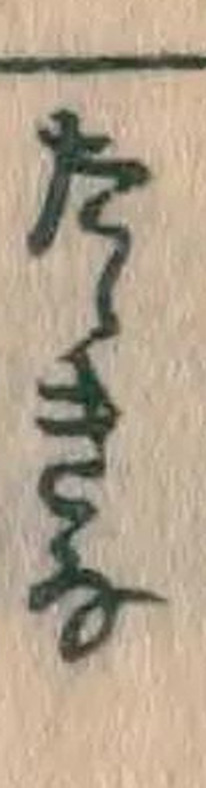たゝき菜
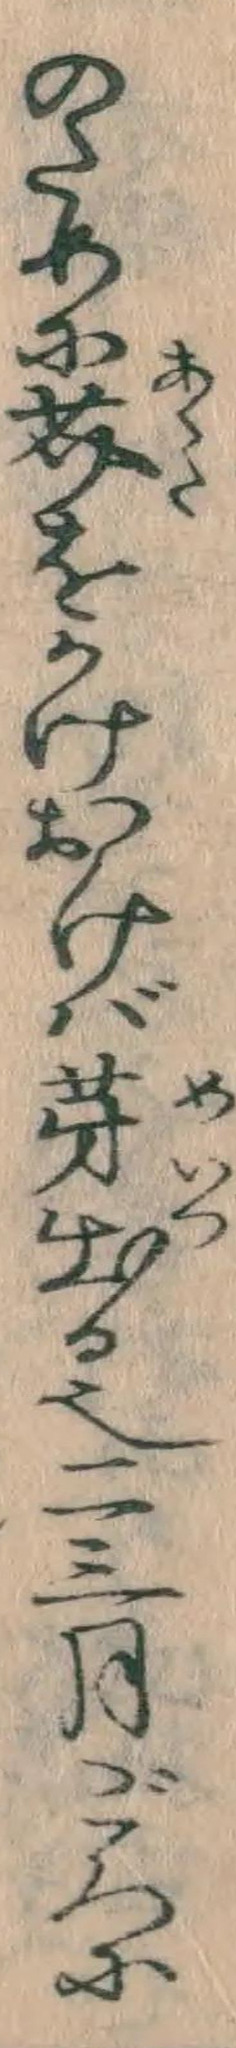のために芥をかけおけば芽出る也二三月ごろに
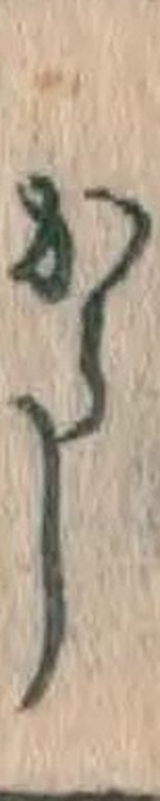からし
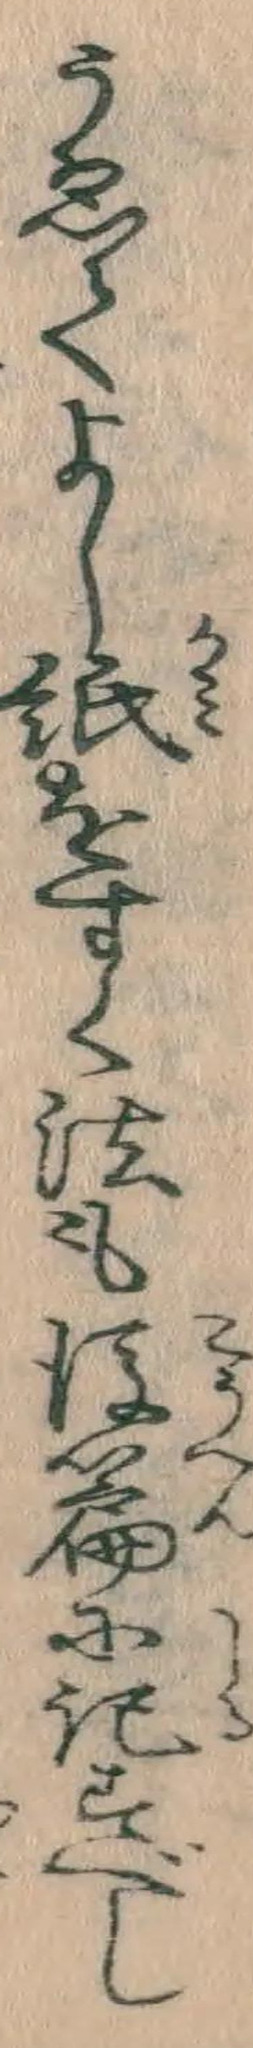うゑてよし紙をすく法も後篇に記すべし
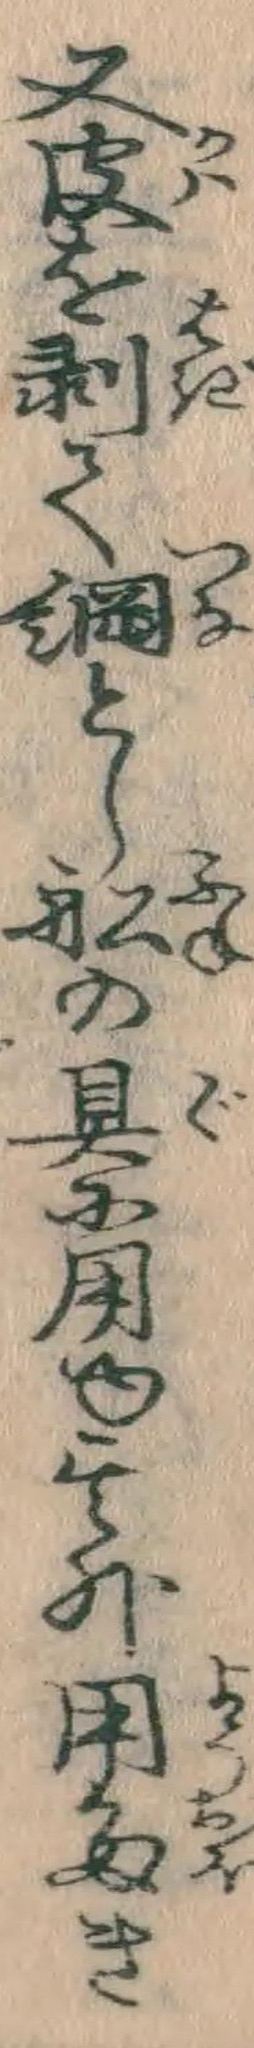又皮を剥て綱とし船の具に用ゆ其外用多き
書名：広益秘事大全 3巻. [5]
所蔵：国立国会図書館 National Diet Library, JAPAN
